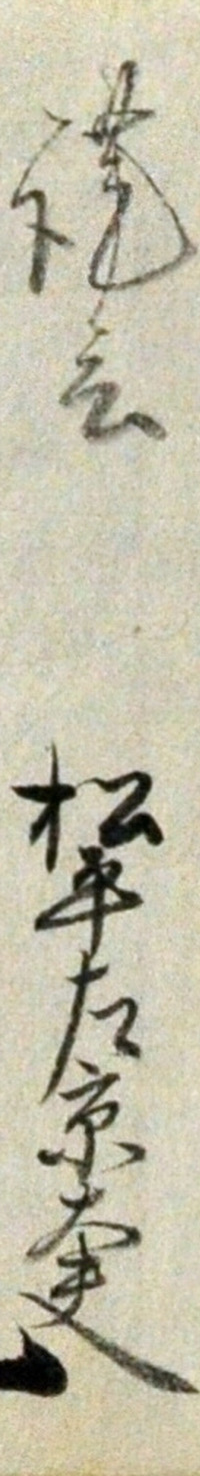謹言松平左京大夫
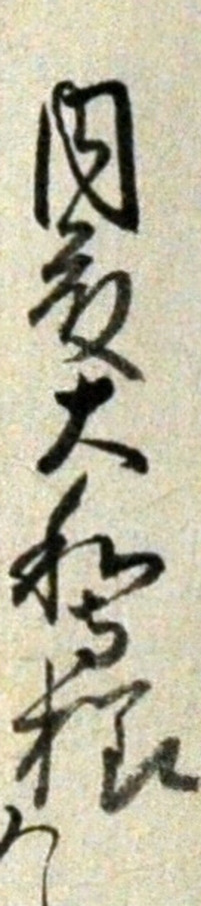内藤大和守様
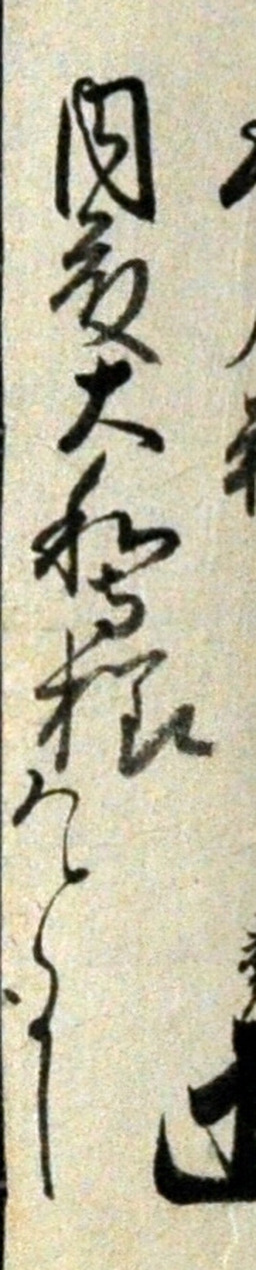内藤大和守様
